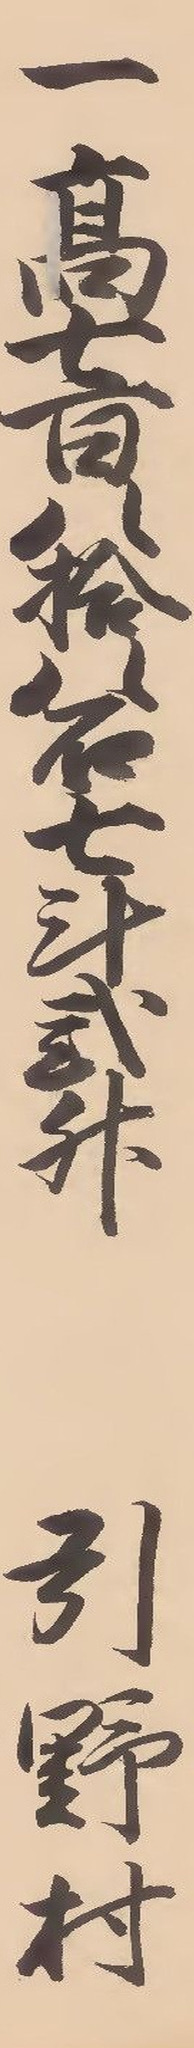一高七百八拾八石七斗弐升引野村
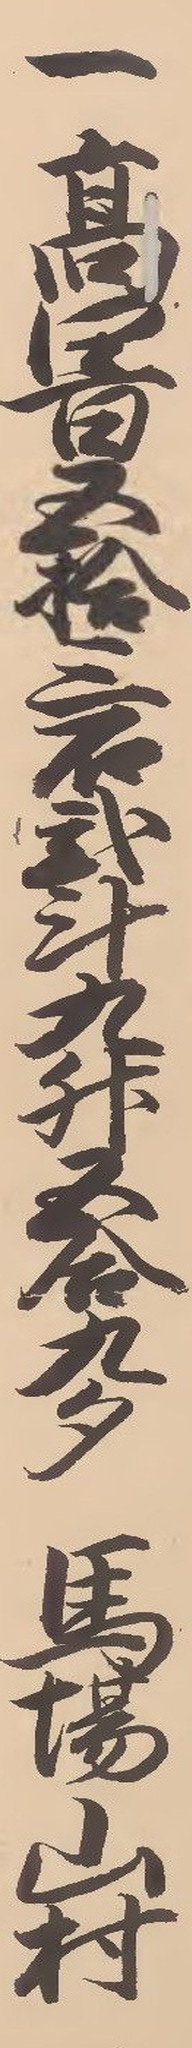一高四百五拾三石弐斗九升五合九勺馬場山村
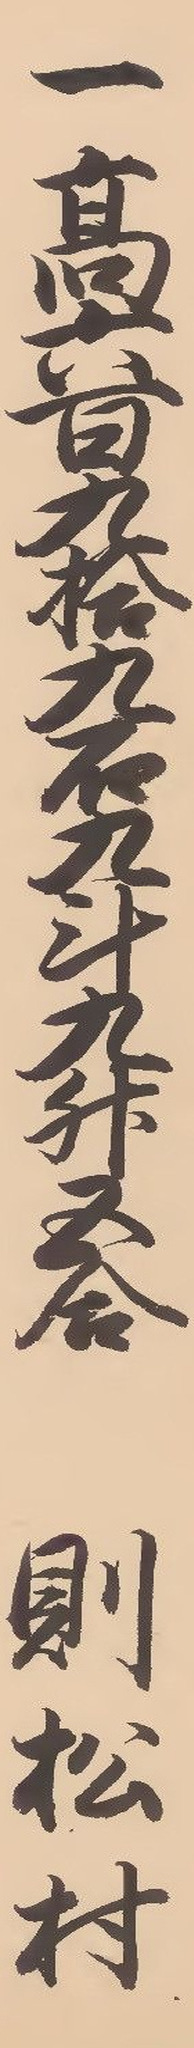一高六百九拾九石九斗九升五合則松村
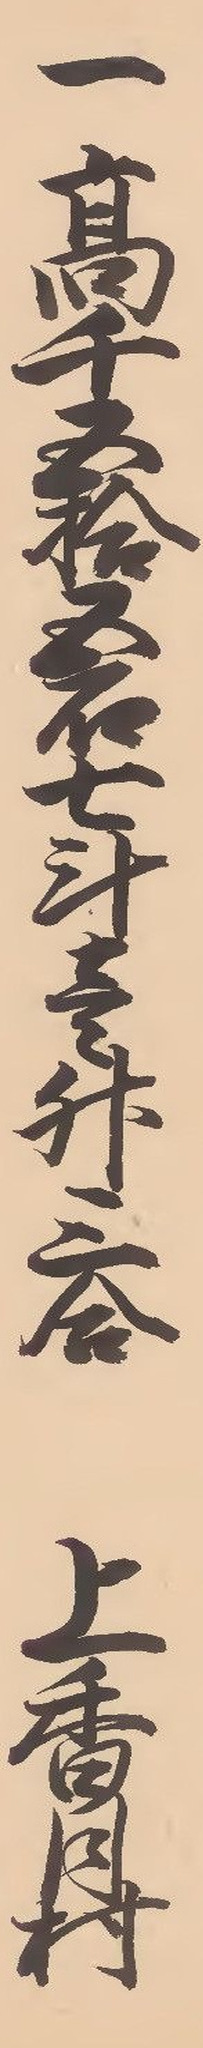一高千五拾五石七斗壱升三合上香月村
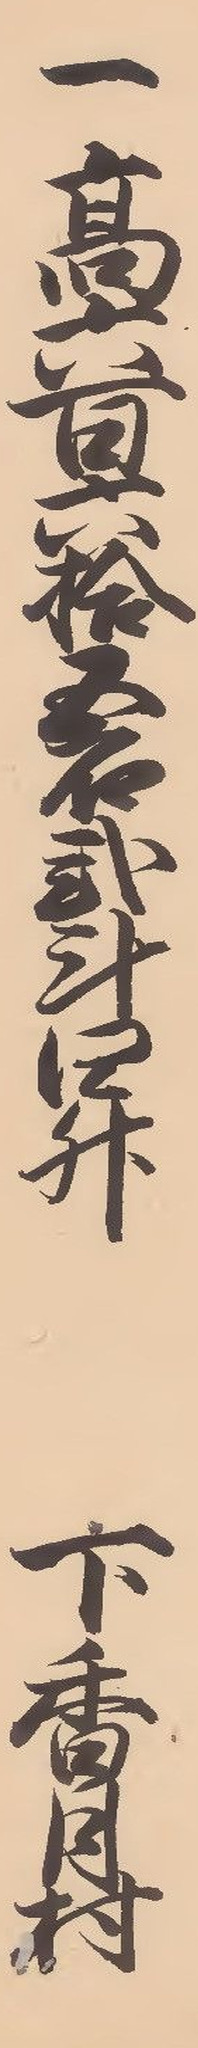一高六百六拾五石弐斗四升下香月村

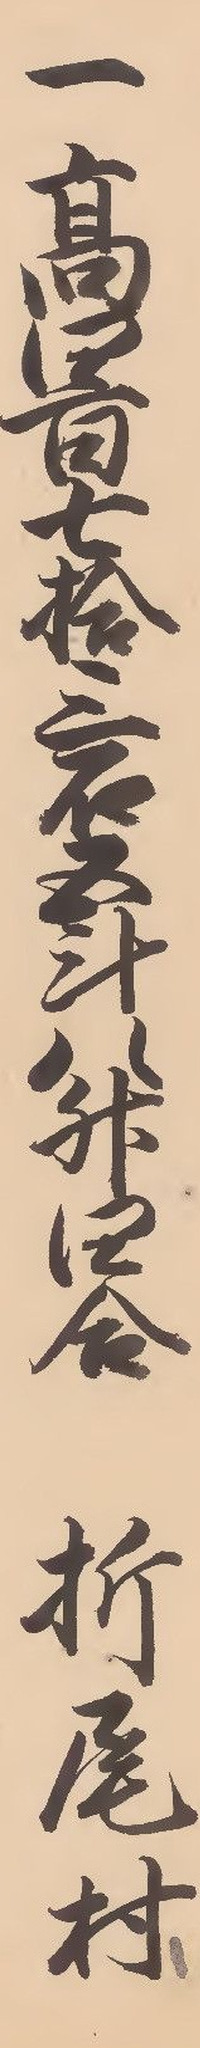一高四百七拾三石五斗八升四合折尾村
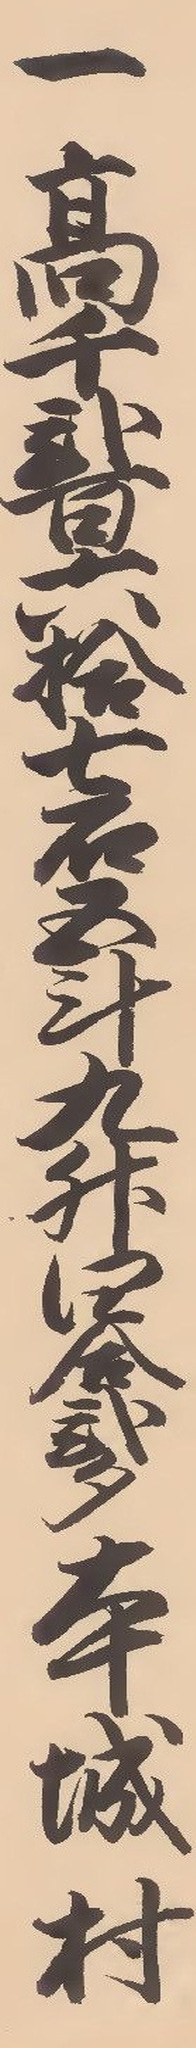一高千弐百六拾七石五斗九升四合弐勺本城村
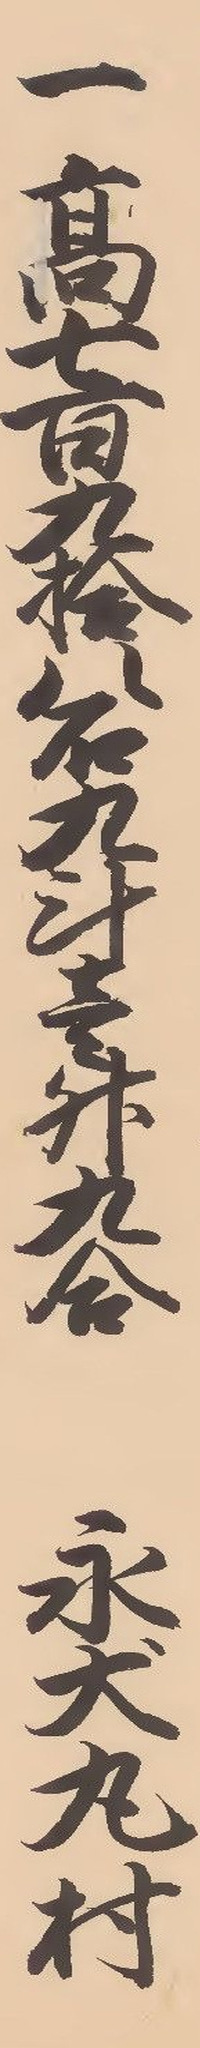一高七百九拾八石九斗壱升九合永犬丸村
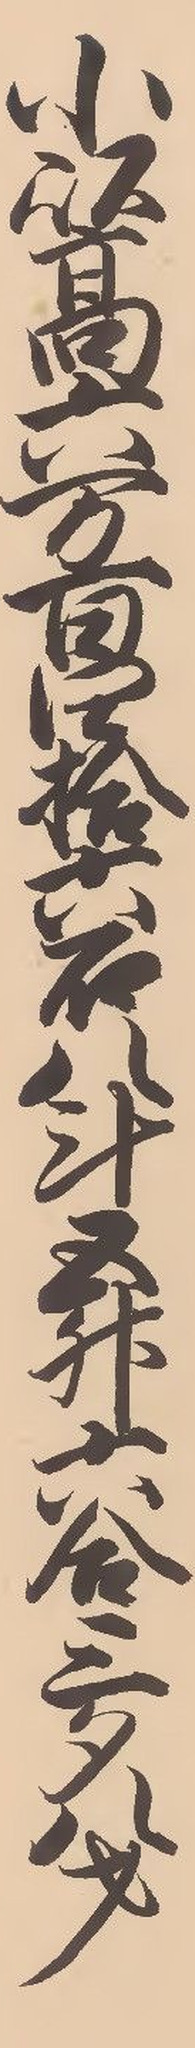小以高六万百四拾六石八斗五升六合三勺八才

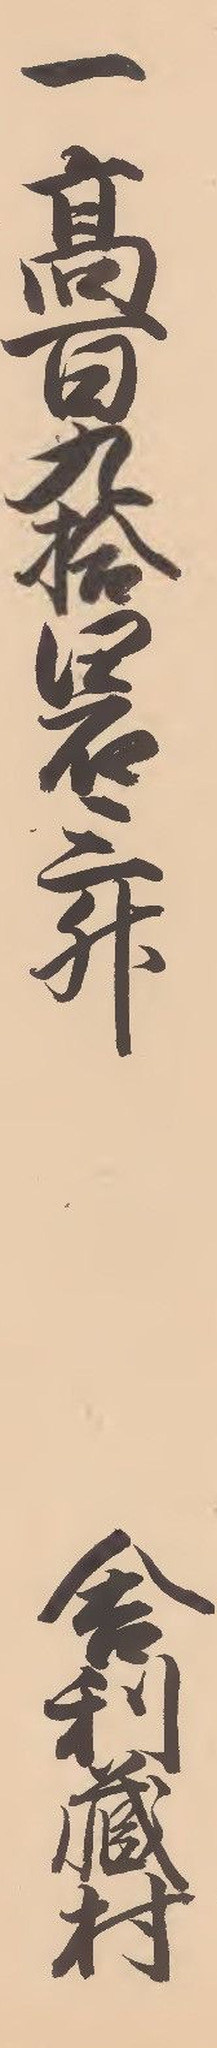一高百九拾四石三升舎利蔵村
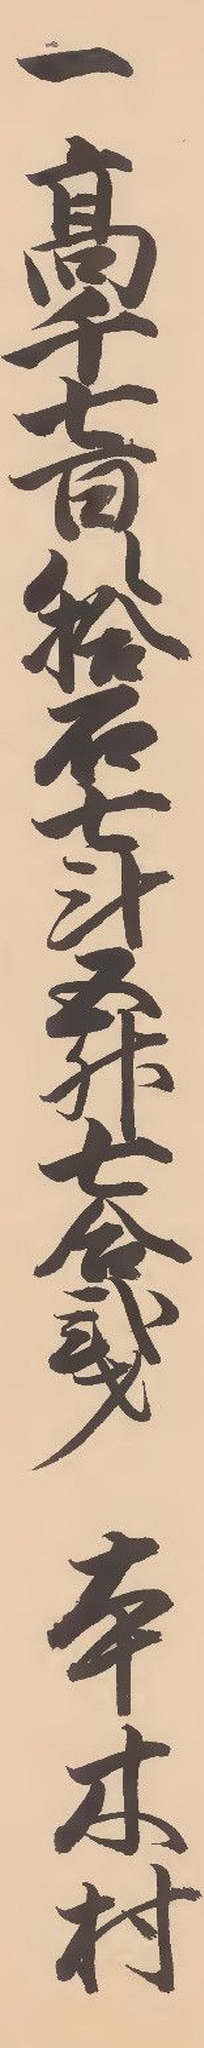一高千七百八拾石七斗五升七合弐才本木村
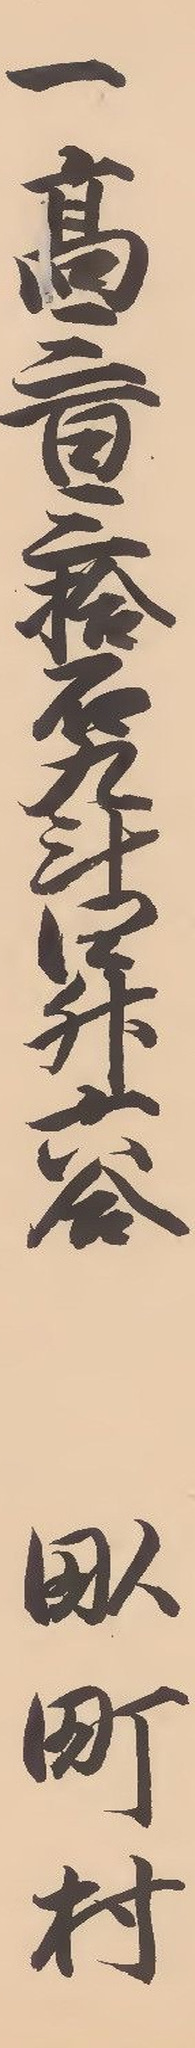一高三百三拾石九斗四升六合畝町村
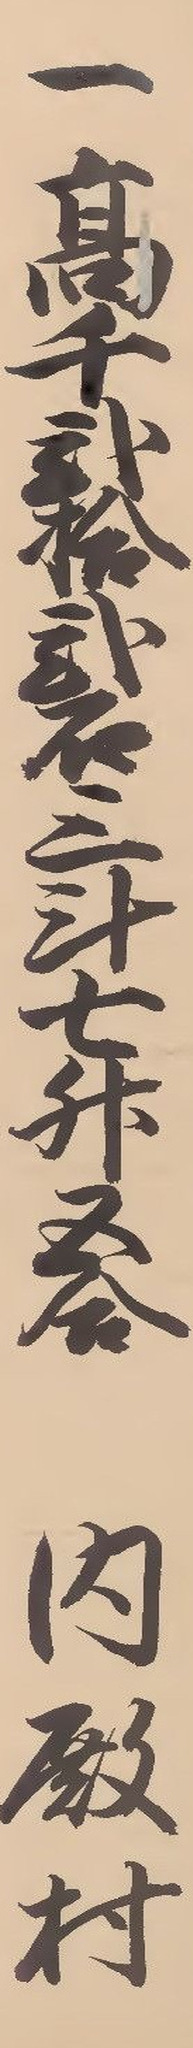一高千弐拾弐石三斗七升五合内殿村
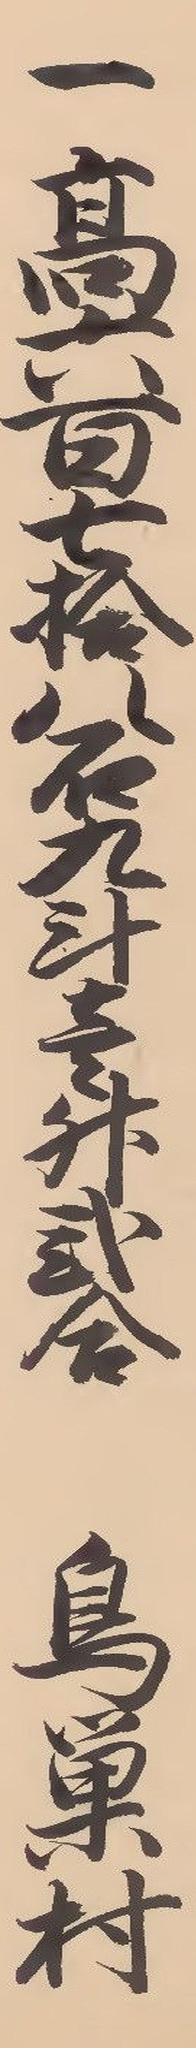一高六百七拾八石九斗壱升弐合鳥巣村
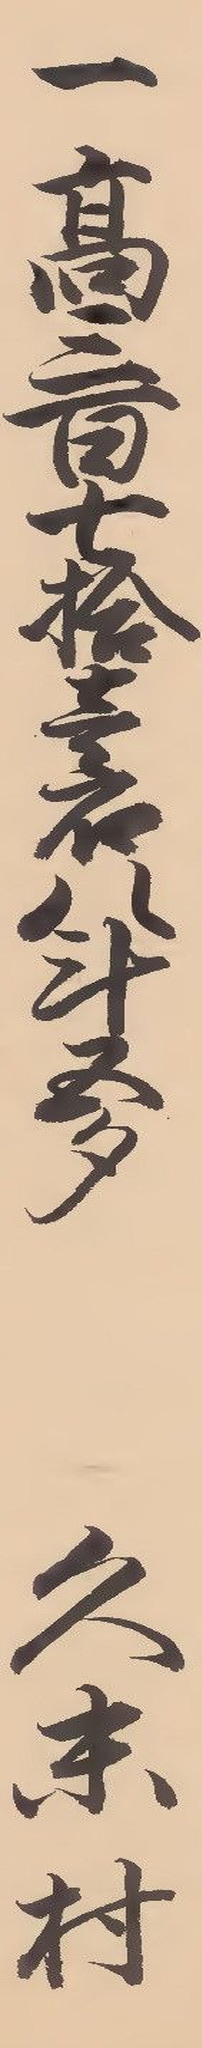一高三百七拾壱石八斗五勺久末村
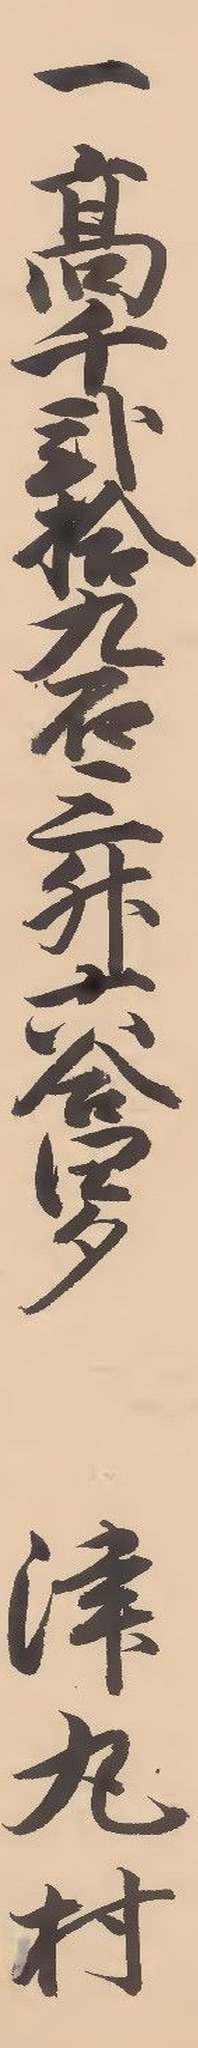一高千弐拾九石三升六合四勺津丸村
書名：筑前国郷帳
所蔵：国立公文書館 National Archives of Japan
